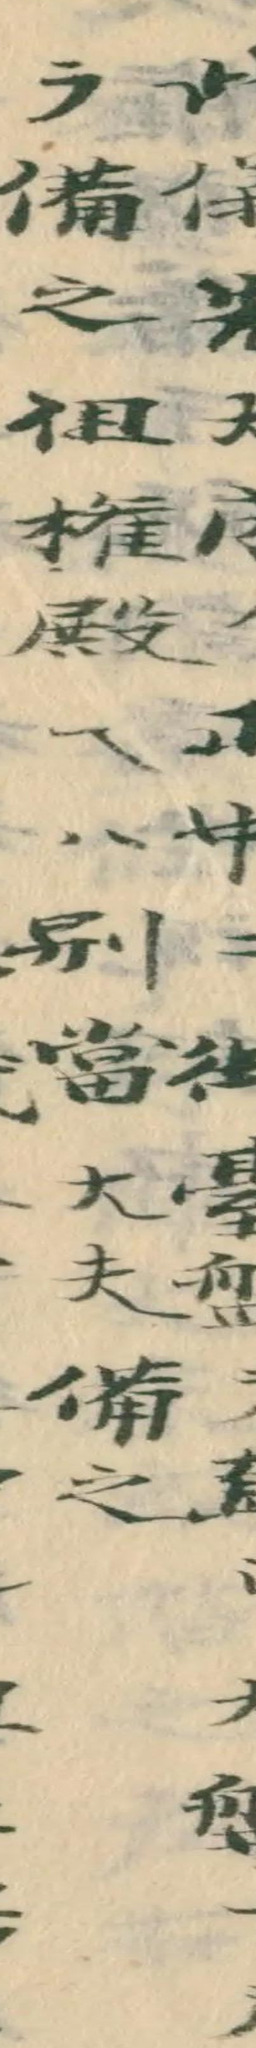ラ備之但権殿ヘハ別当大夫備之

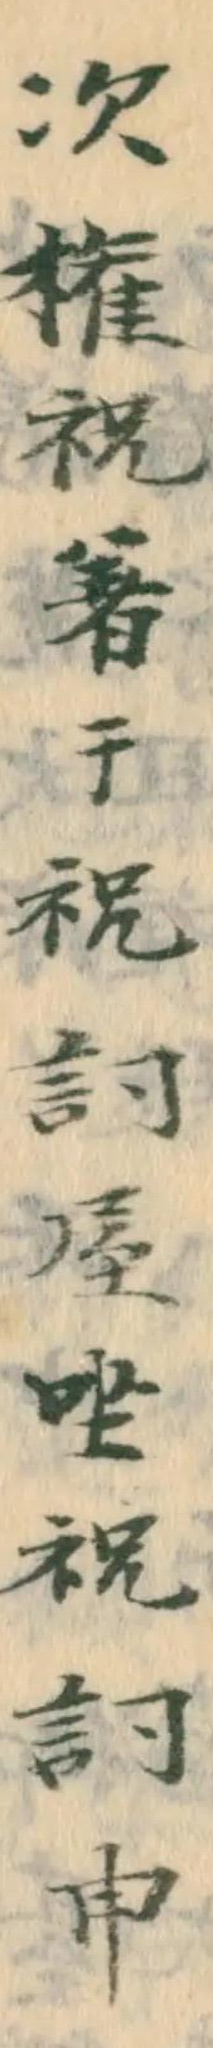次権祝着于祝詞屋坐祝詞申
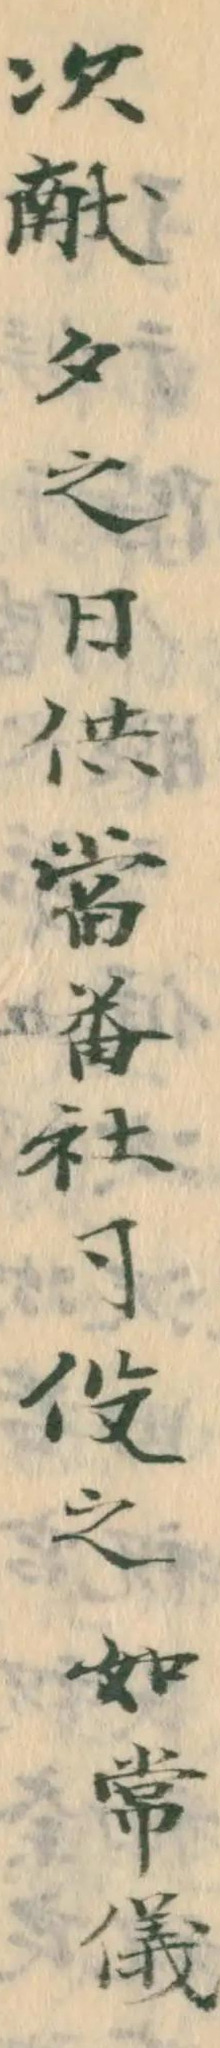次献夕之日供当番社司役之如常儀
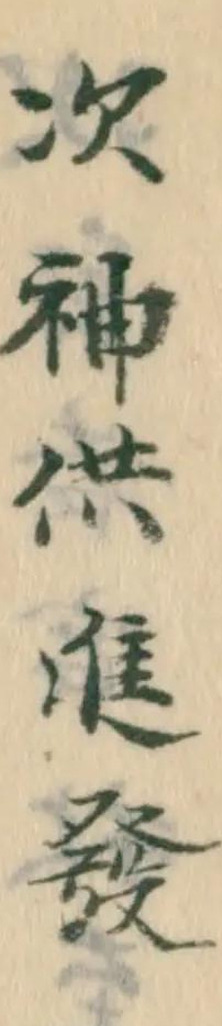次神供進発
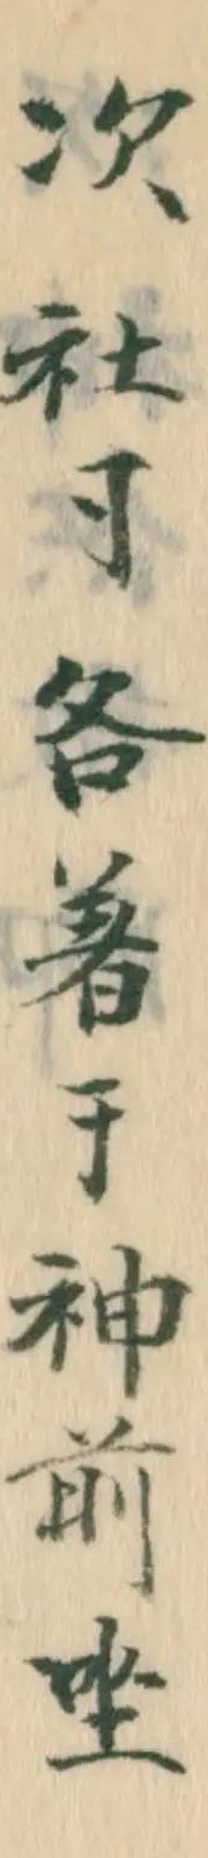次社司各着于神前坐
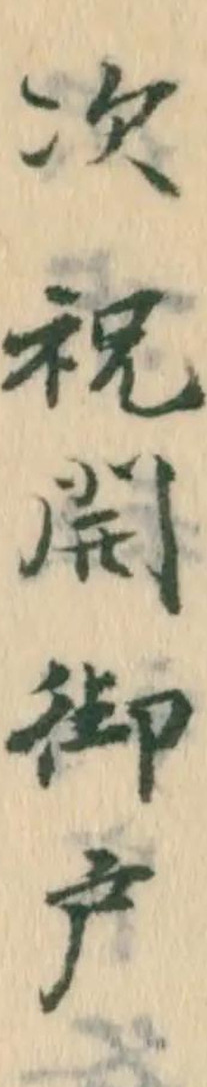次祝開御戸
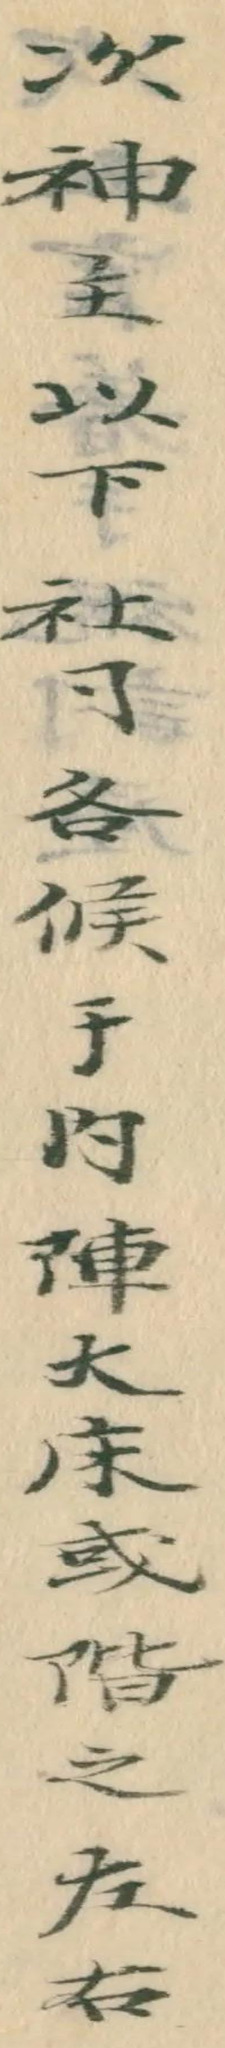次神主以下社司各侯于内陣大床或階之左右

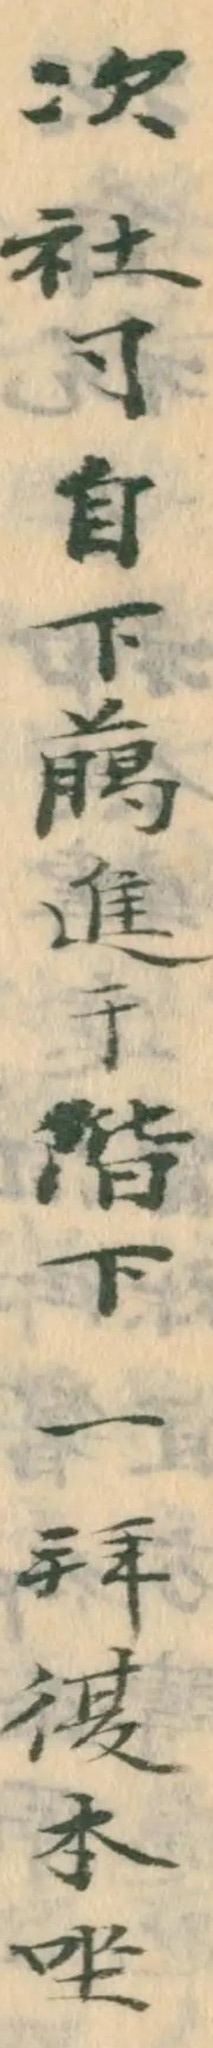次社司自下臈進于階下一拝復本坐
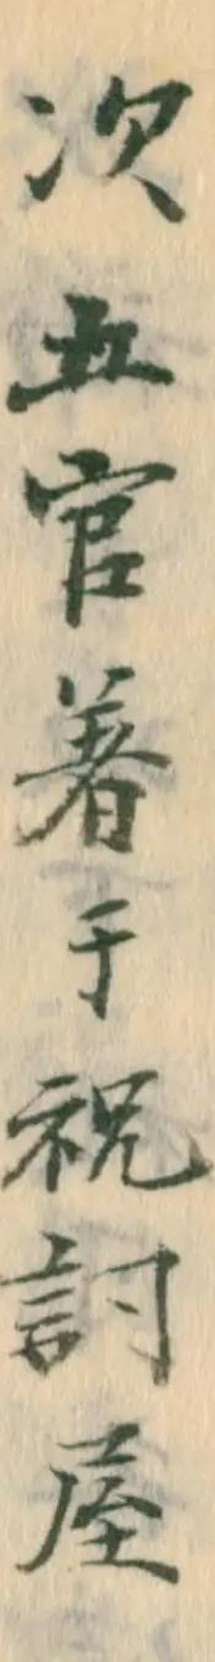次五官着于祝詞屋
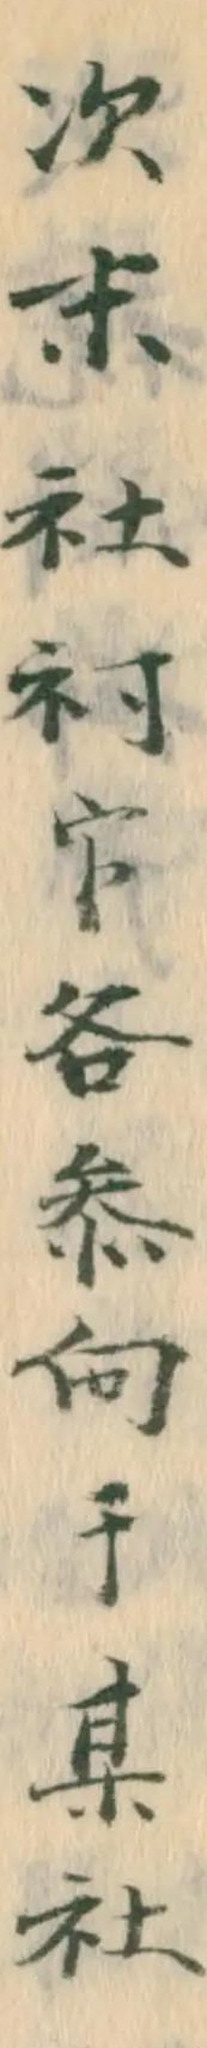次末社祠官各参向于某社
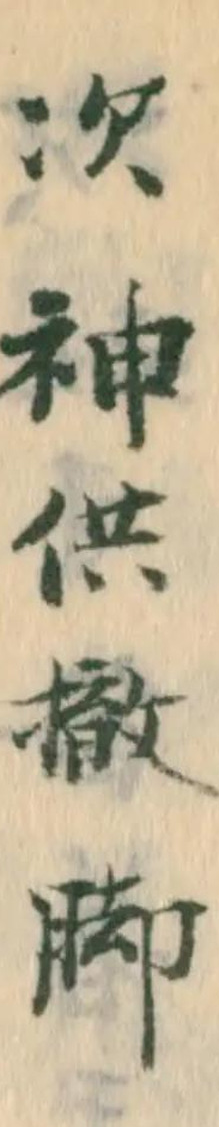次神供撤脚
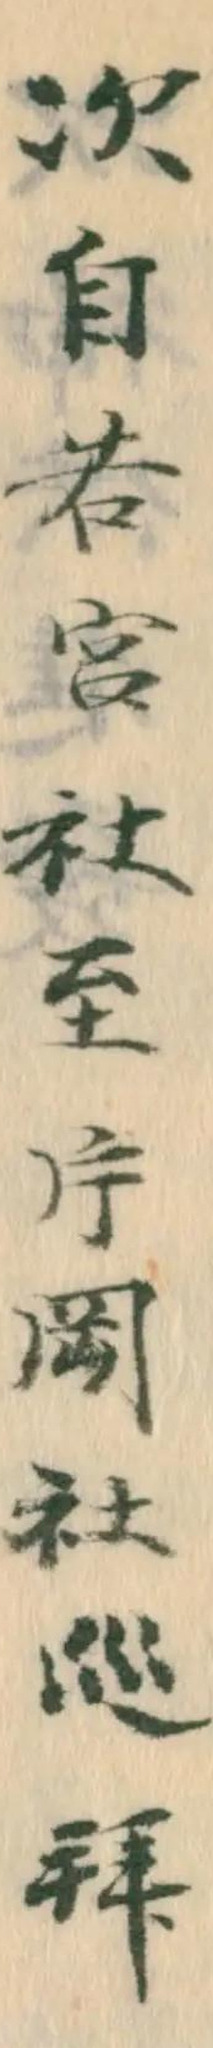次自若宮社至片岡社巡拝

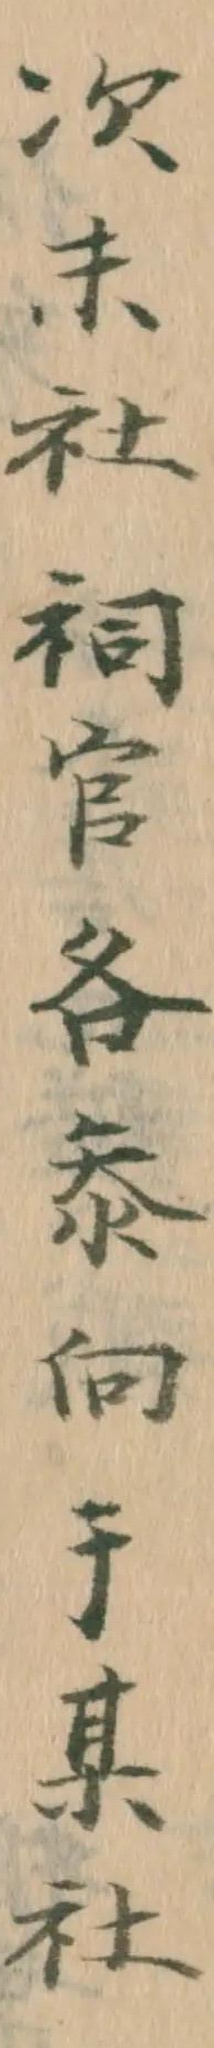次末社祠官各参向于某社
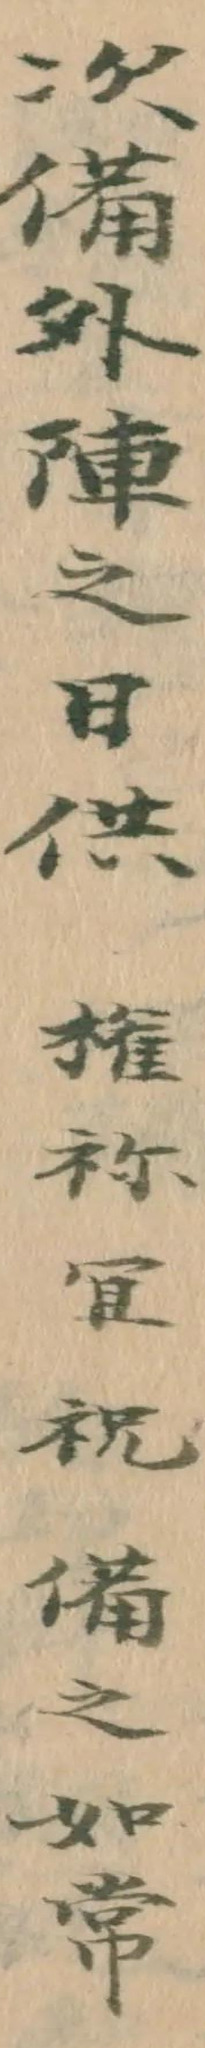次備外陣之日供権禰宜祝備之如常
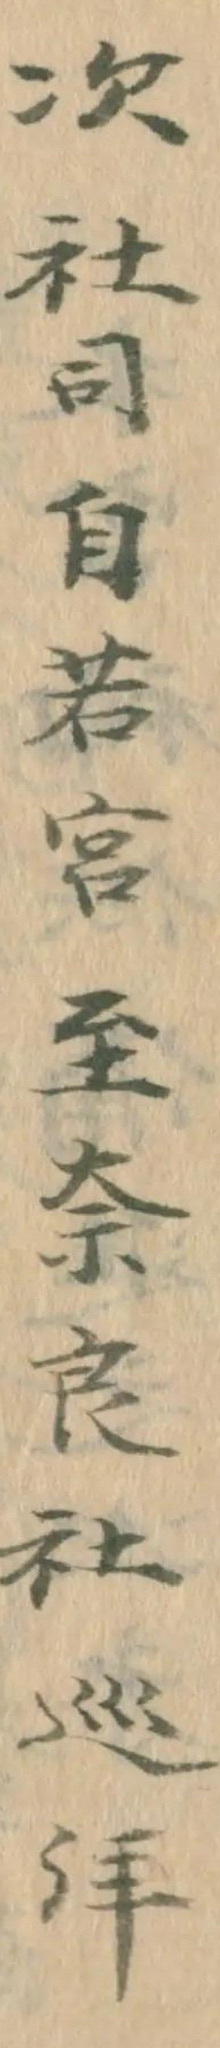次社司自若宮至奈良社巡拝
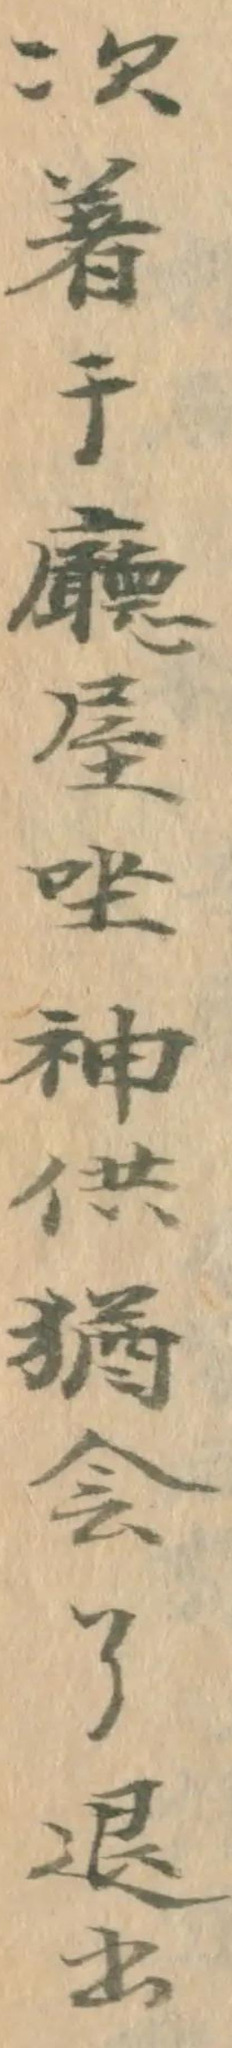次着于庁屋坐神供猶会了退出
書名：賀茂社記録. 第5冊
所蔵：国立国会図書館 National Diet Library, JAPAN
